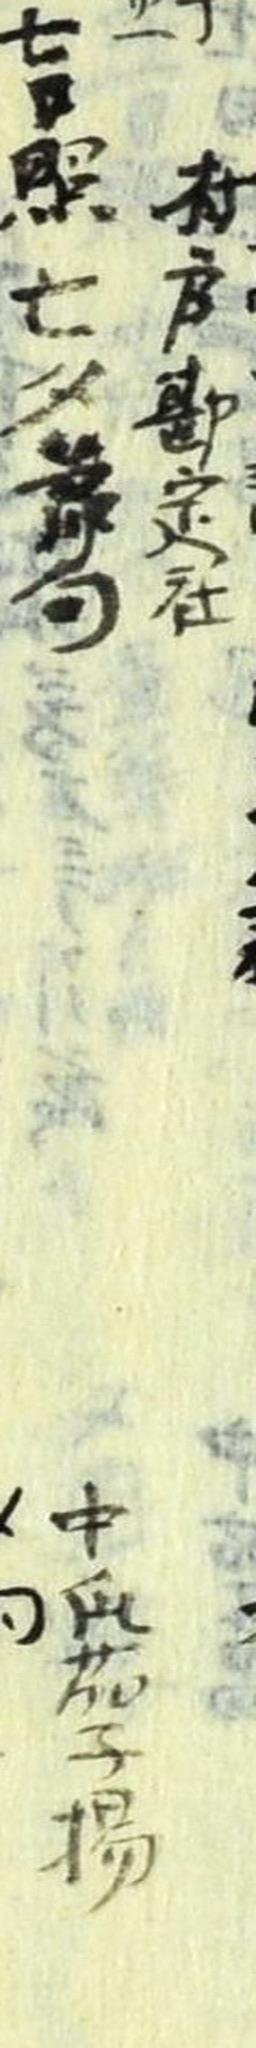七日照七夕節句中瓜茄子揚
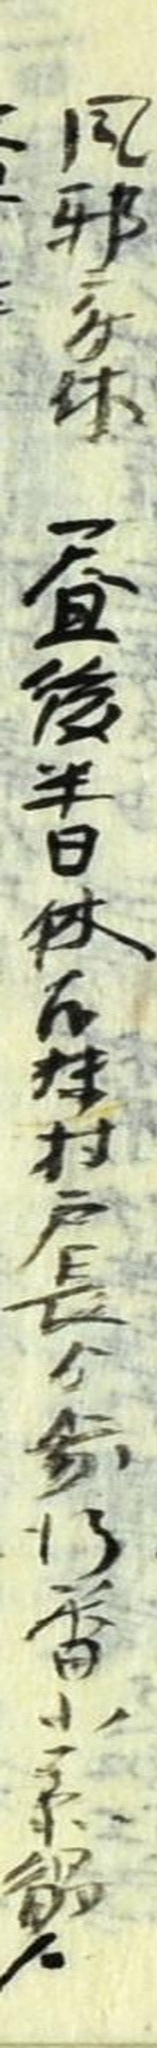風邪ニ付休昼後半日休候様村戸長ゟ歩行番小兵衛触候
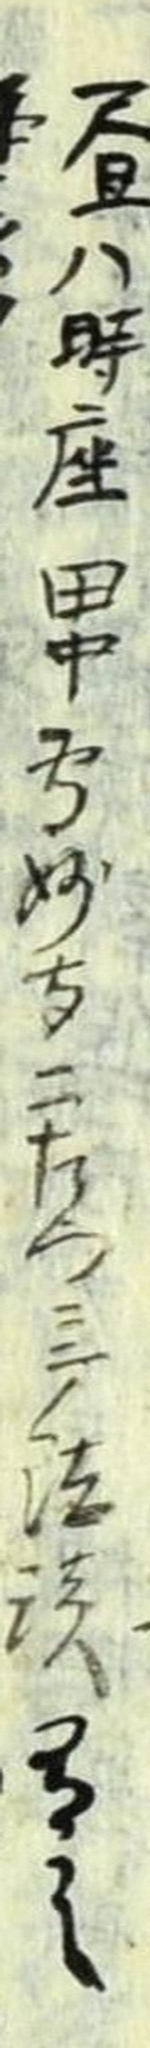昼八時座田中専妙寺二左衛門ニテ法談有之
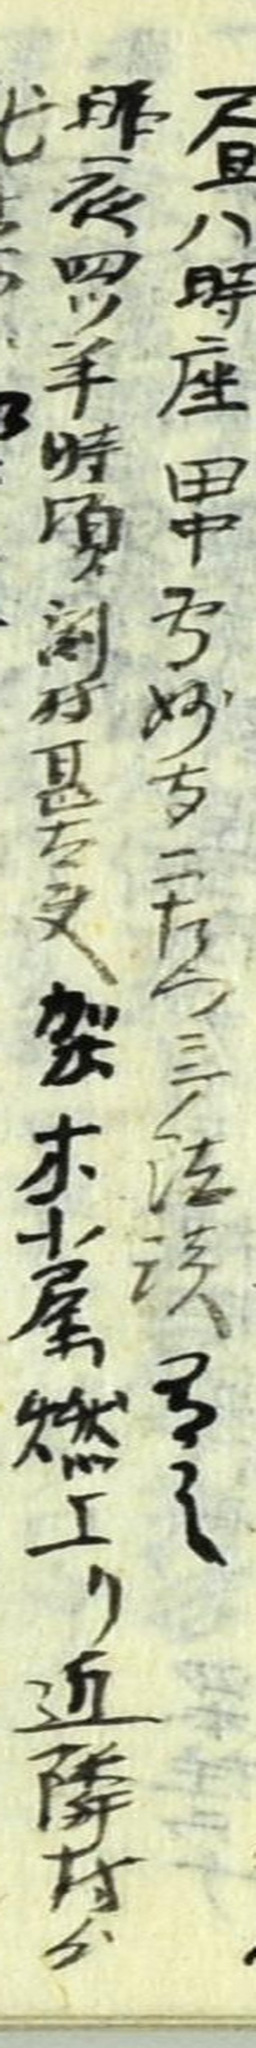此夜四ツ半時頃ゟ淵村甚太夫架木小屋燃上り近隣村ゟ
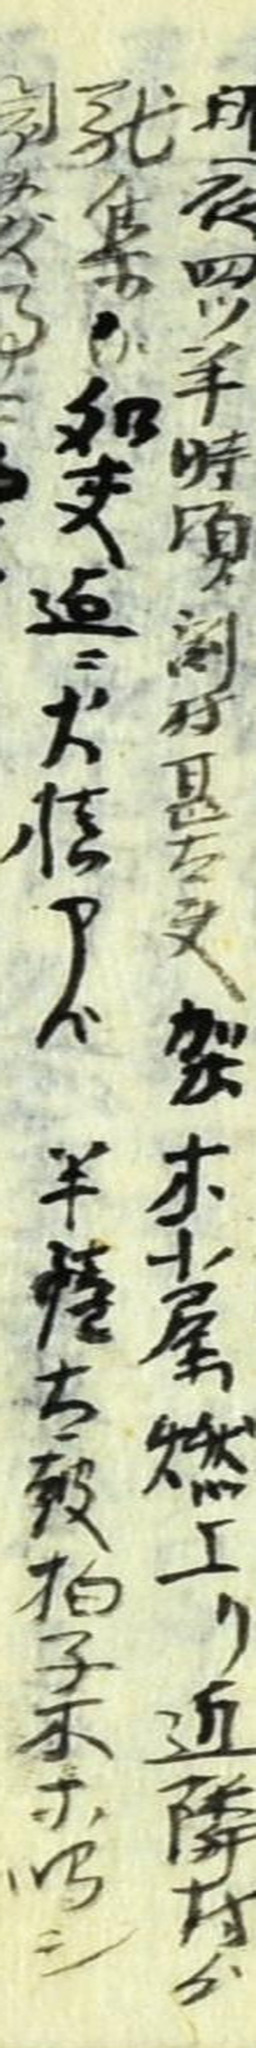馳集候処夫迄に火慎申候半鐘太鼓拍子木等鳴シ
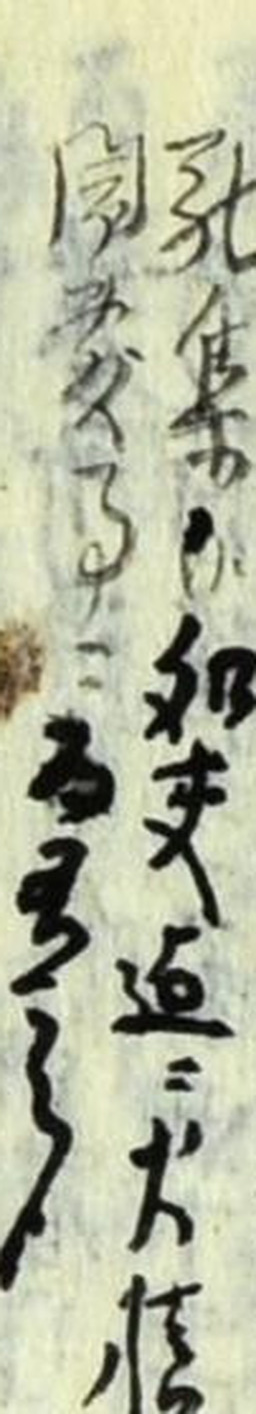閙敷事ニ而有之候
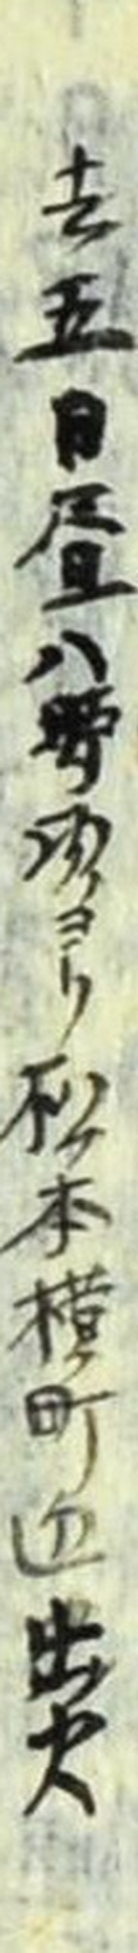去五日昼八時頃より松本横町辺出火
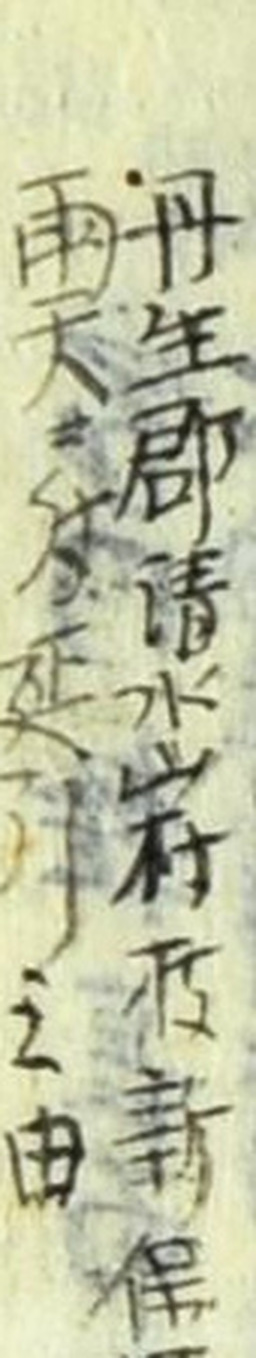雨天に付延引之由
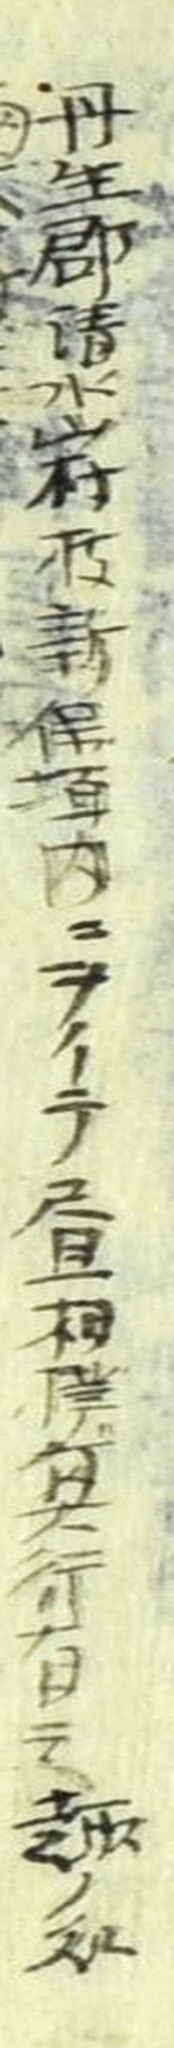丹生郡清水山村枝新保垣内ニヲイテ昼相撲興行有之趣ノ処

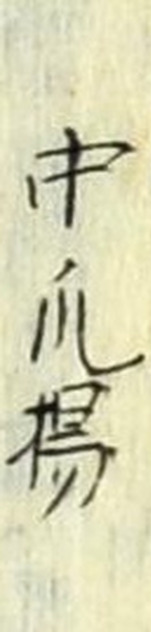夕瓜揚
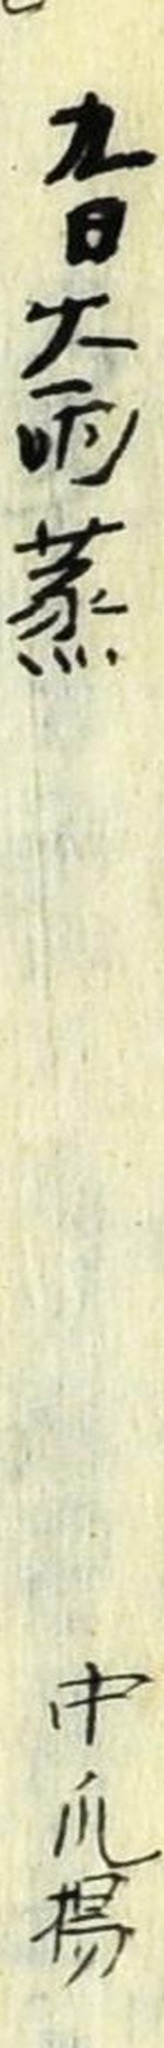九日大雨蒸中瓜揚
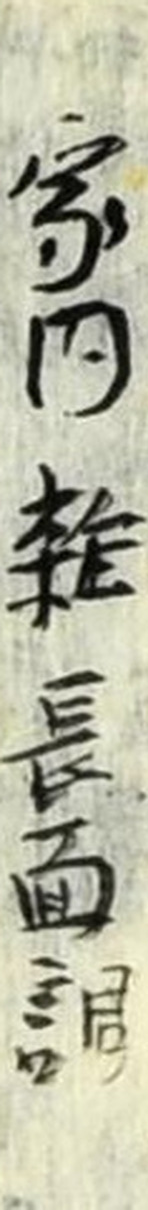家内雑長面調
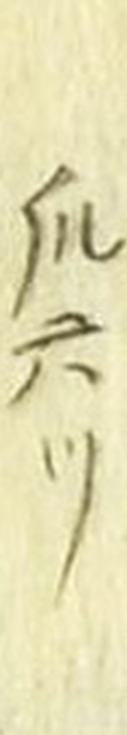瓜六ツ
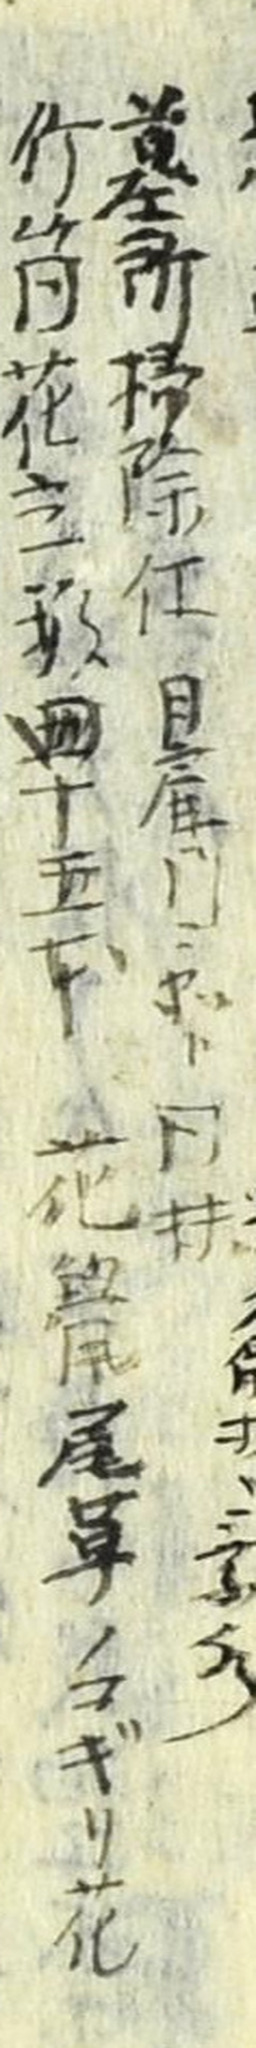竹筒花立数四十五本花鼠尾草ノコギリ花
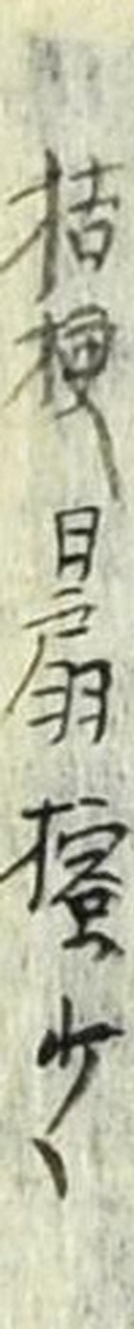桔梗日扇櫁少々
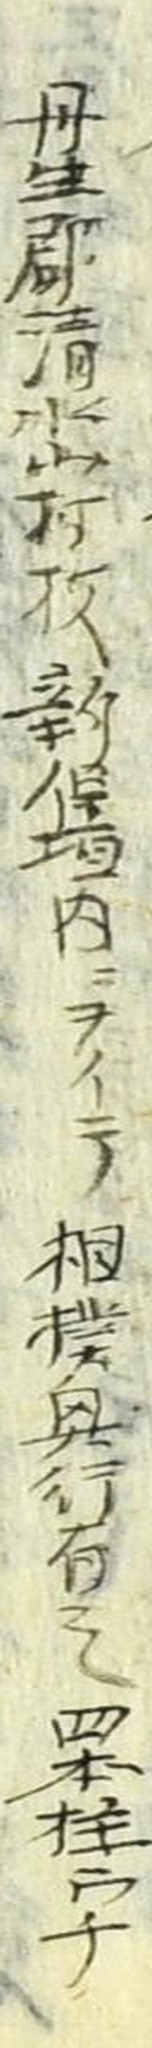丹生郡清水山村枝新保垣内ニヲイテ相撲興行有之四本柱ウチ
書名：（日記）
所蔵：福井県文書館 Fukui Prefectural Archives
